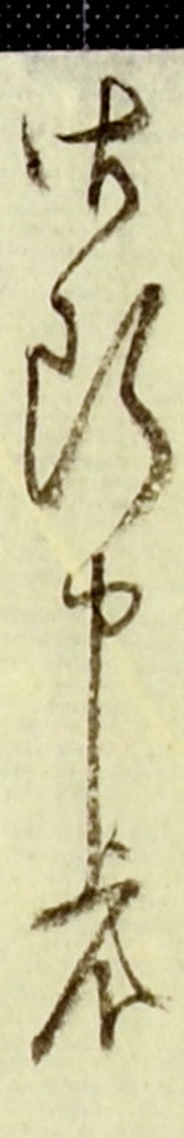御断申上候
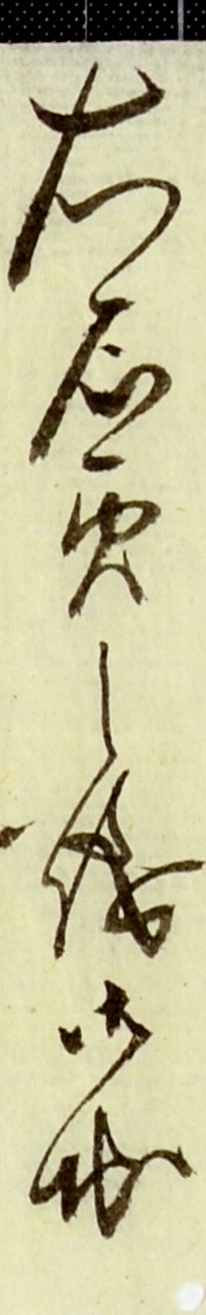右石灰之儀御地
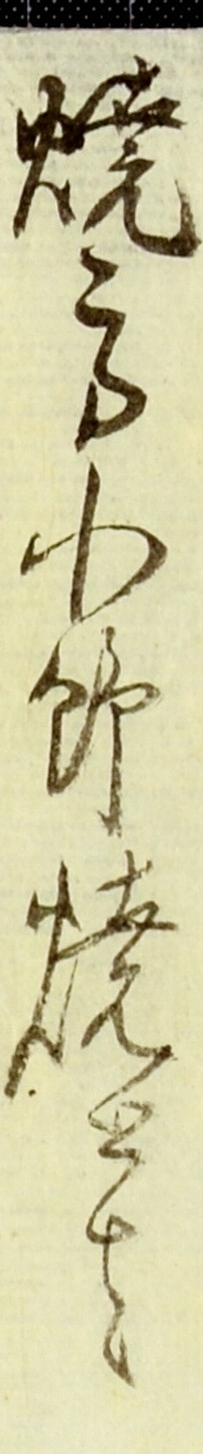焼方小野焼とは
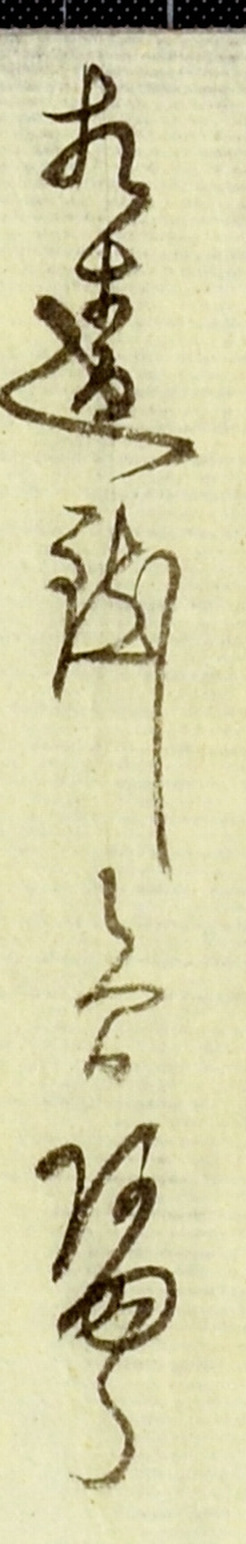相違致し候間あまり
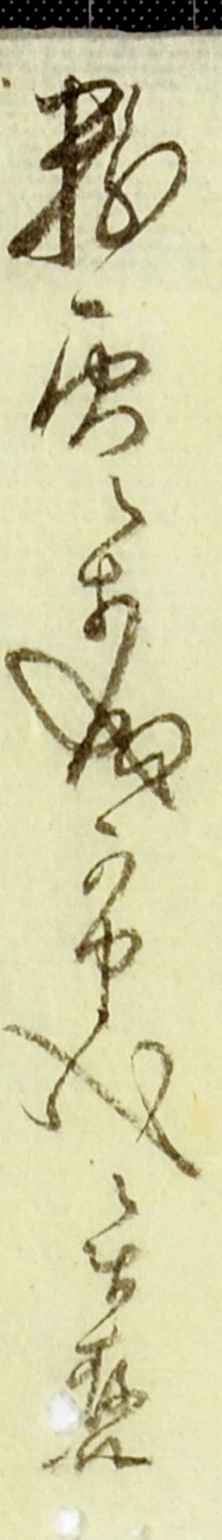粉灰に相成可申哉に奉存候
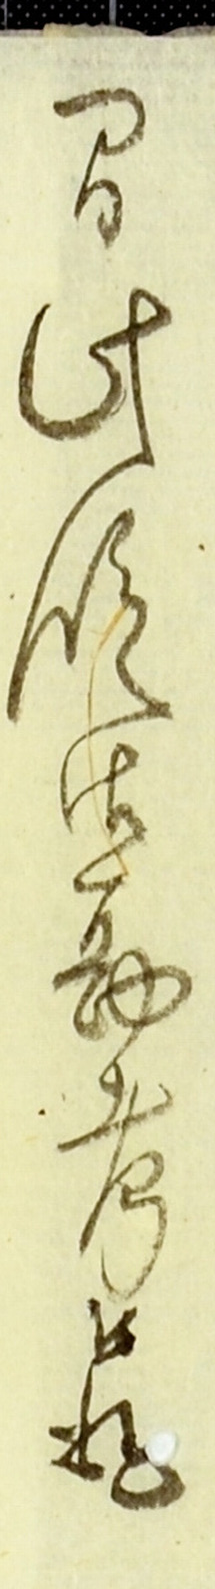間此段御勘考被遊
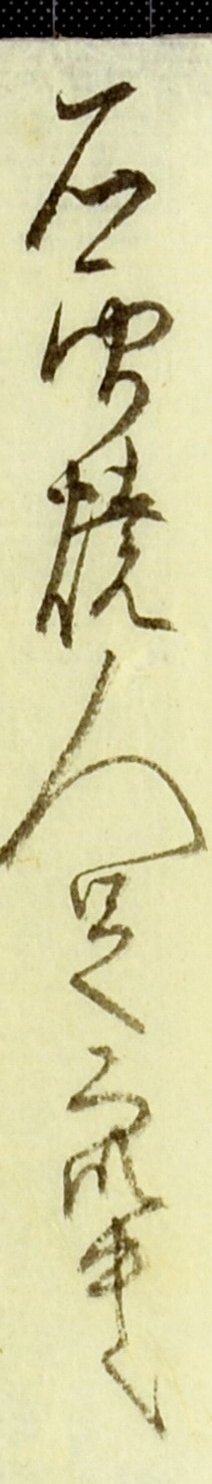石灰焼人足衆中へ
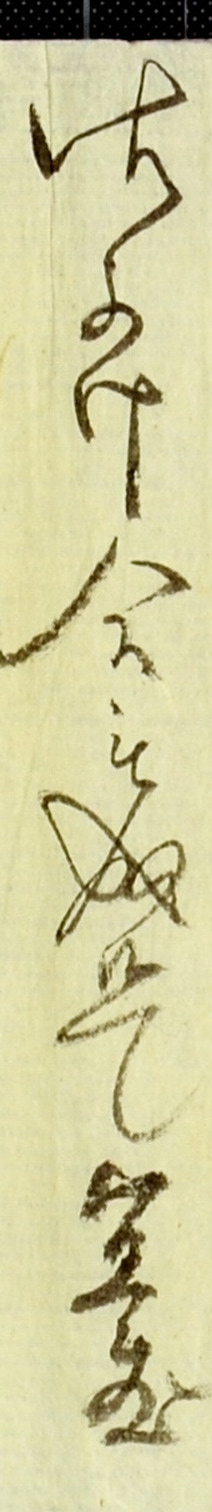御かけ合い被成候て宜敷
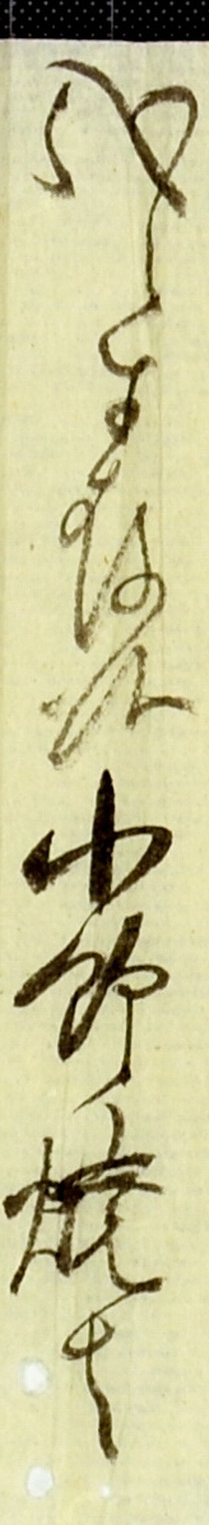哉と奉存候小野焼は
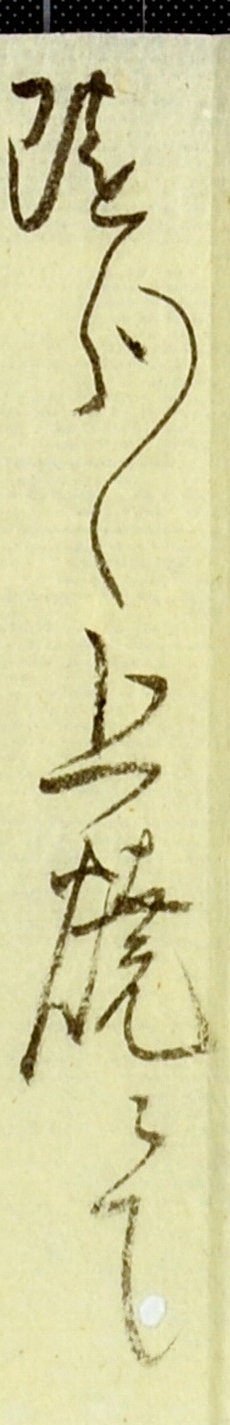随分〳〵上焼にて
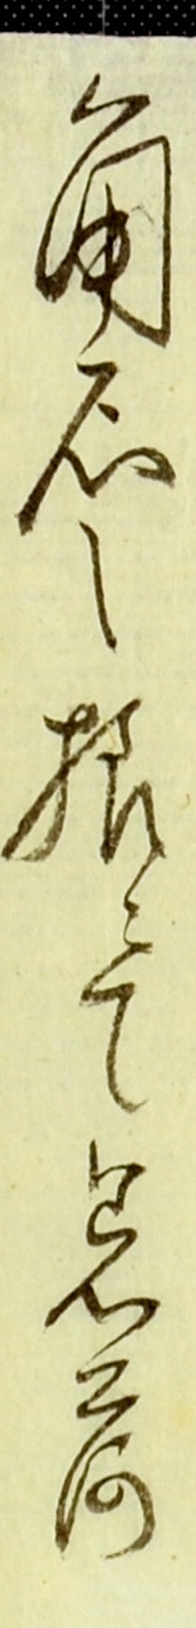角石之様にて着荷
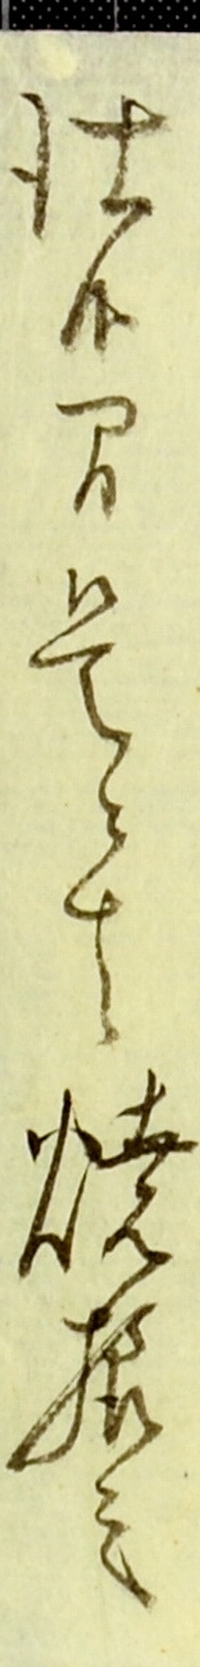仕候間是とは焼様之
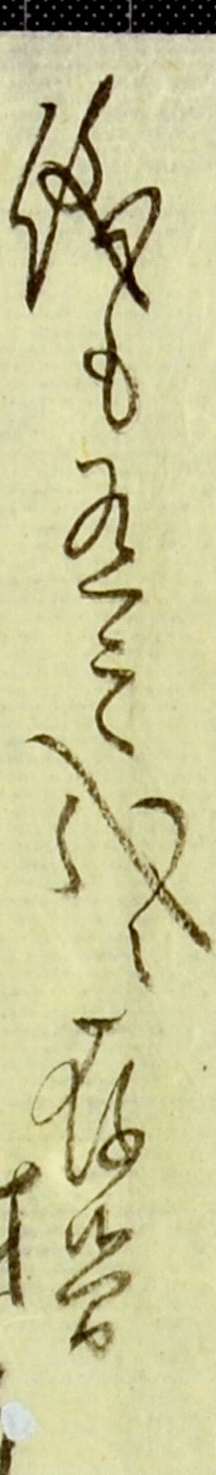儀も有之哉に存候間
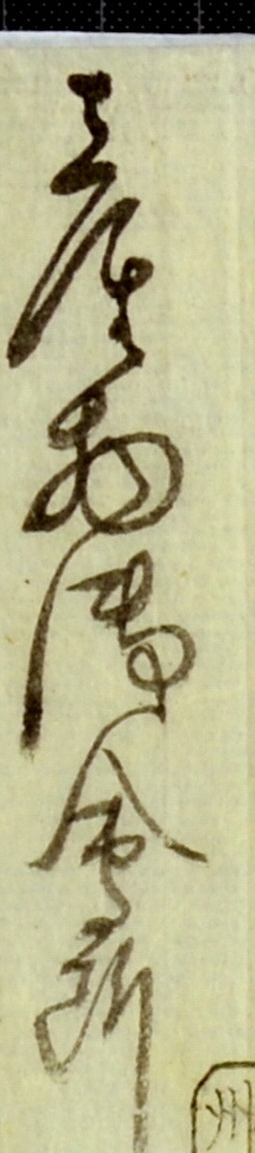産物御会所
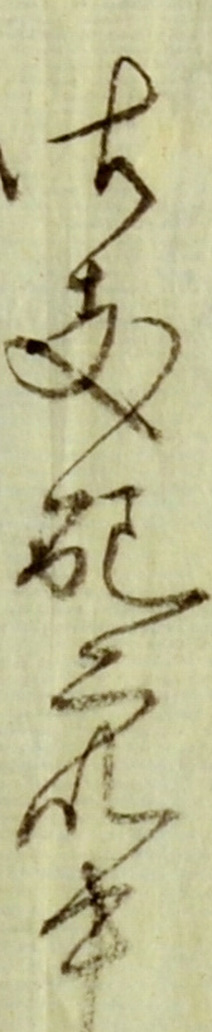御支配衆中

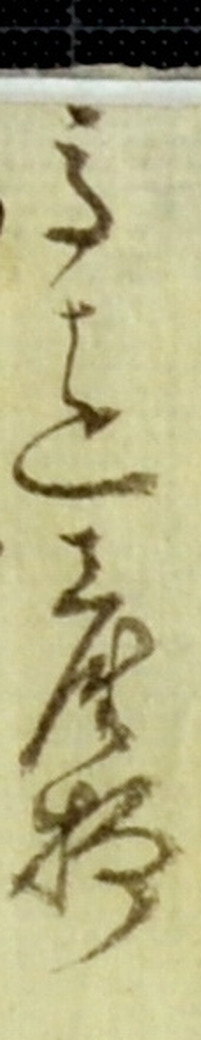高遠産物
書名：書状
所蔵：伊那市立高遠町図書館・合同会社AMANE
